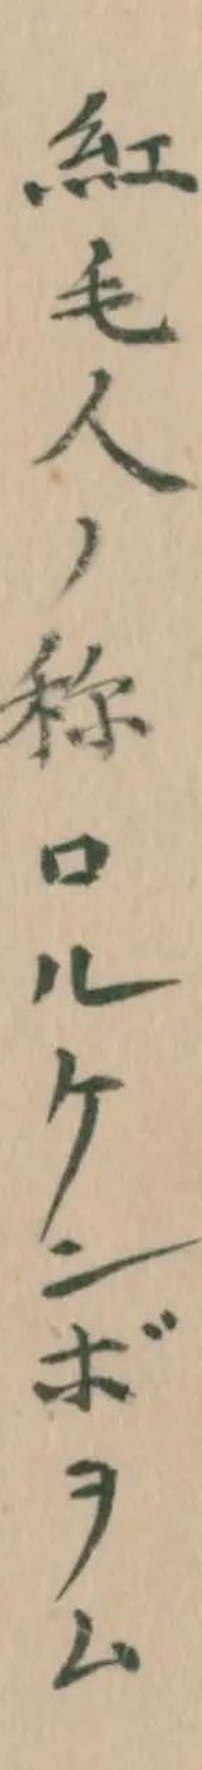紅毛人ノ称ロルケンボヲム
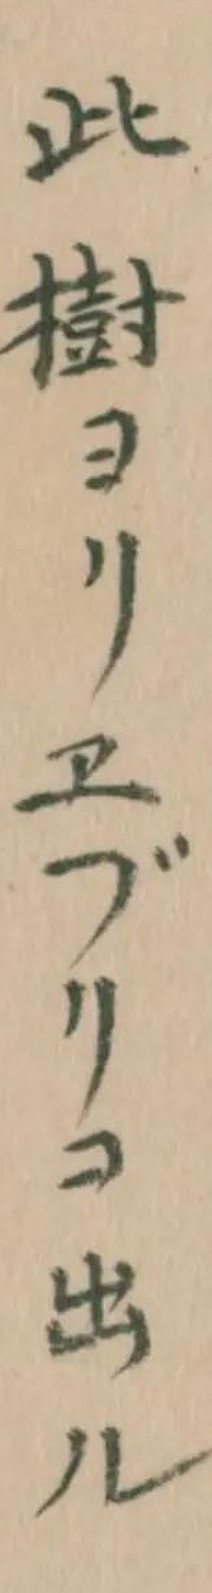此樹ヨリヱブリコ出ル
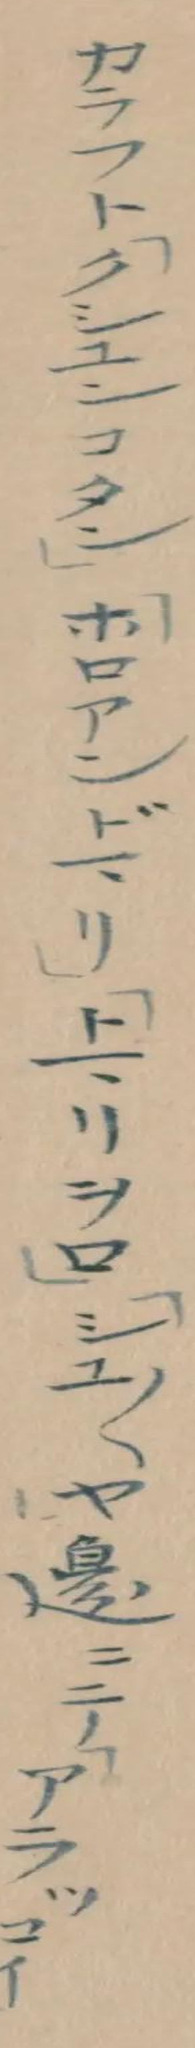カラフト「クシユンコタン」「ホロアンドマリ」「トマリヲロ」「シユ〳〵ヤ」辺「アラッコイ」
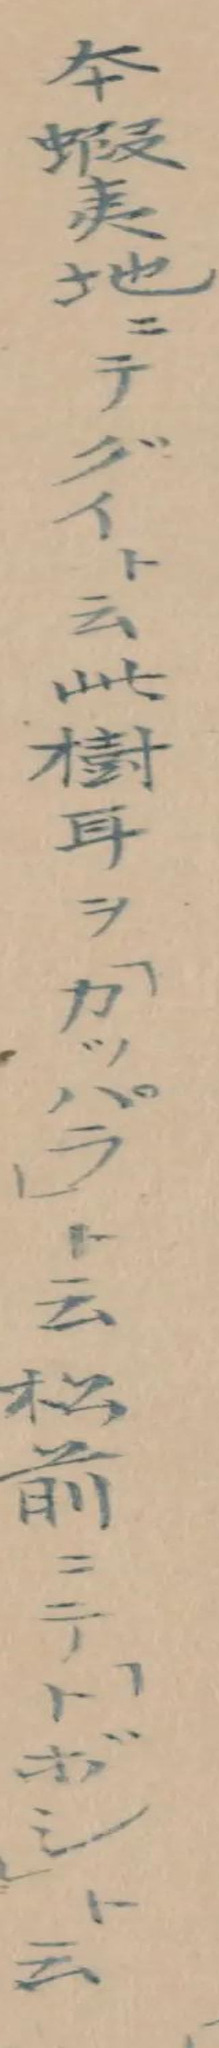本蝦夷地ニテグイト云此樹耳ヲ「カッパラ」ト云松前ニテ「トボシ」ト云
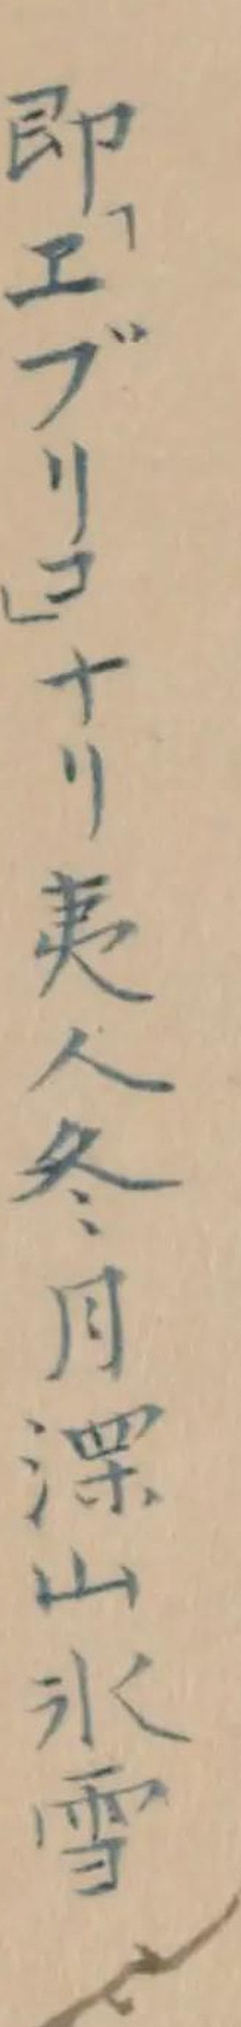即「ヱブリコ」ナリ夷人冬月深山氷雪
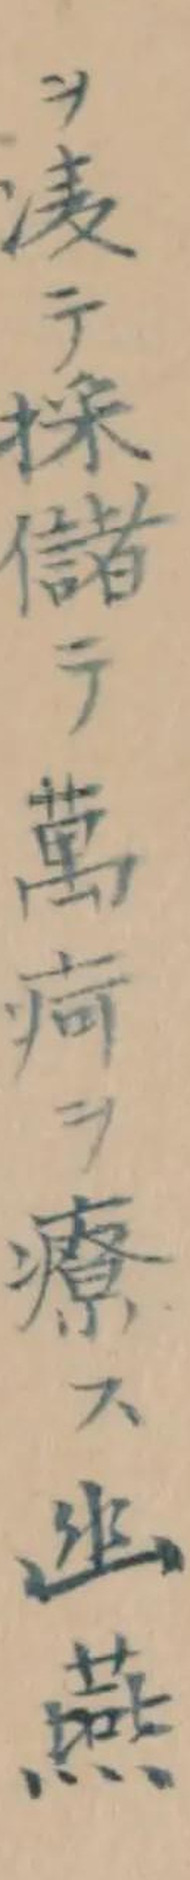ヲ凌テ採儲テ万疴ヲ療ス幽燕
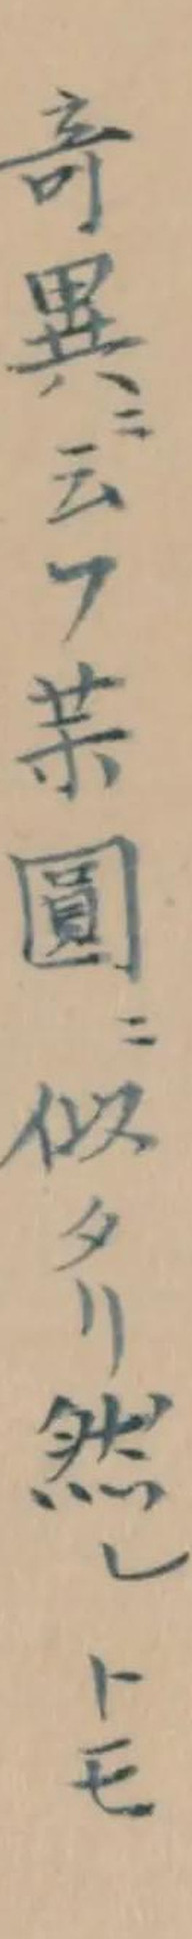奇異云フ円似タリ然レトモ
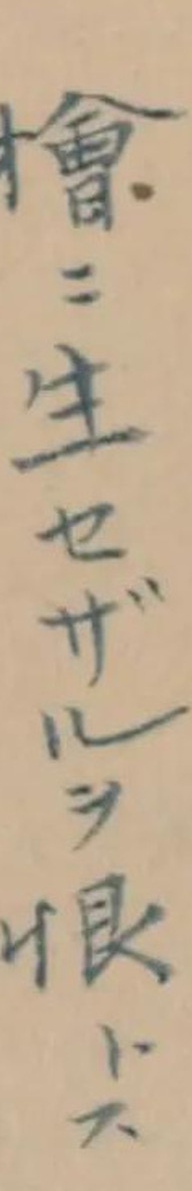檜ニ生セザルヲ恨トス
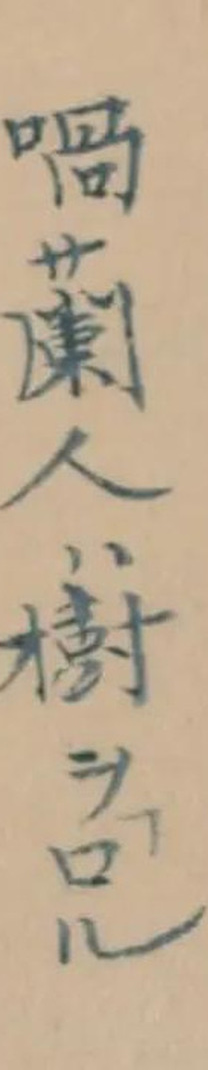喎蘭人ハ樹ヲ「ロル
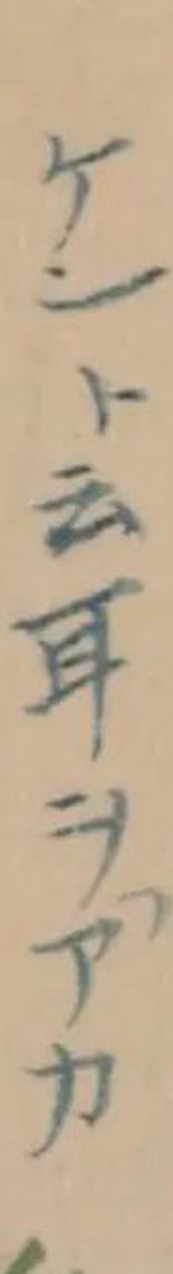ケント云耳ヲ「アカ
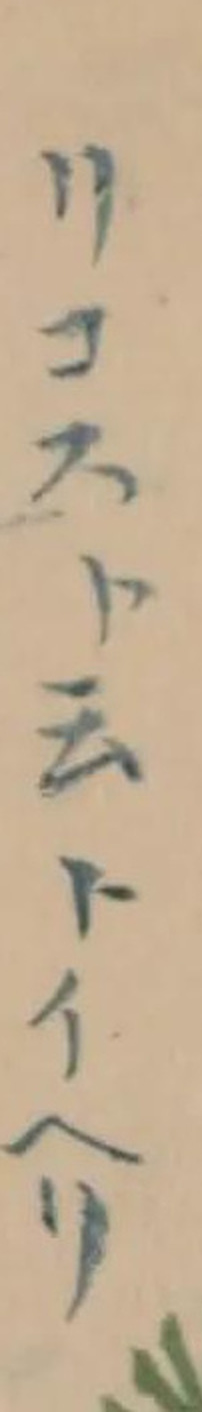リコス」ト云トイヘリ
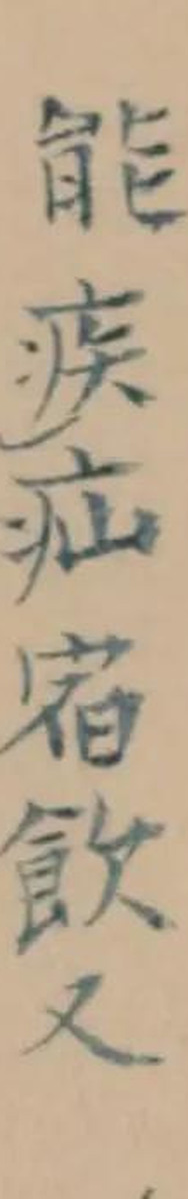能疾疝宿飲又
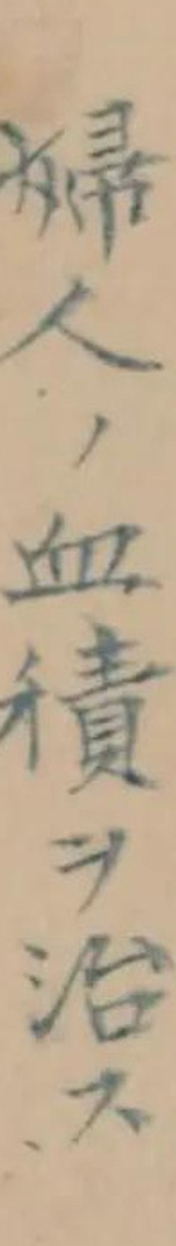婦人ノ血積ヲ治ス
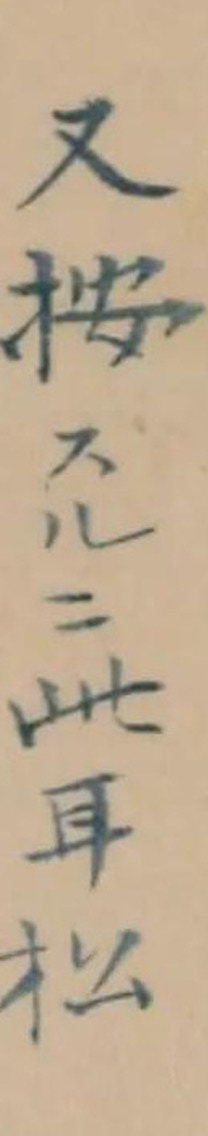又案スルニ此耳松
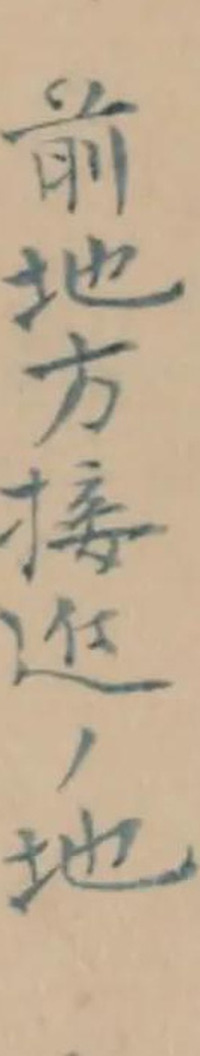前地方接近ノ地
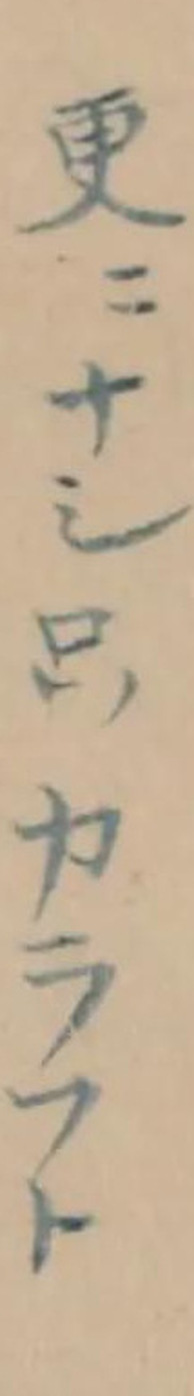更ニナシ只カラフト
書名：蝦夷草木図
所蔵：国立国会図書館 National Diet Library, JAPAN
